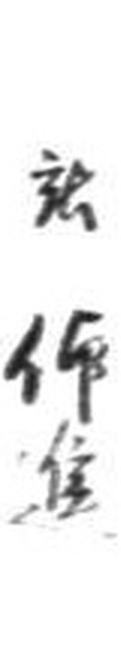被仰進
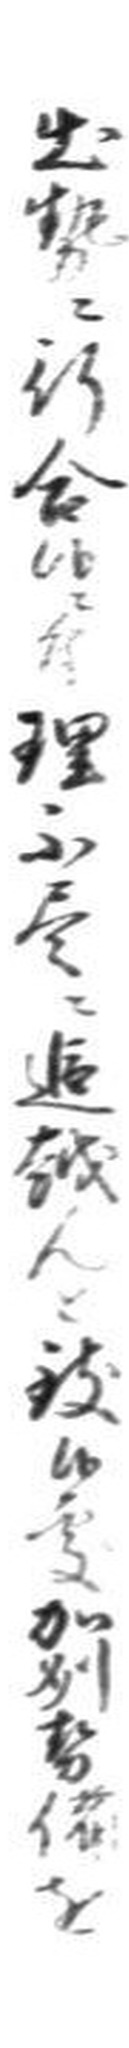出勢ニ行合候ニ付理不尽ニ追越んと致候処加州勢備を

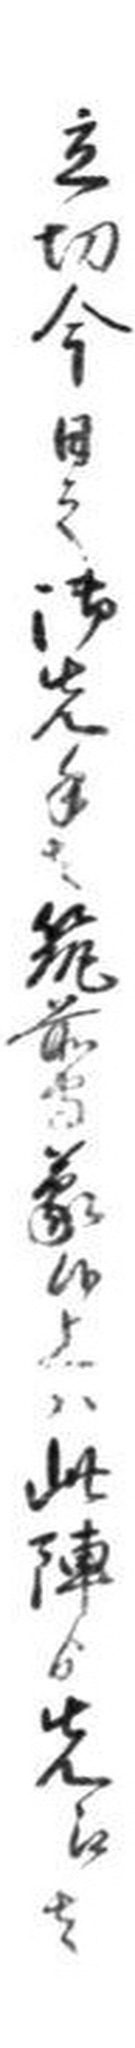立切今日之御先手者筑前守蒙候上ハ此陣ゟ先江者
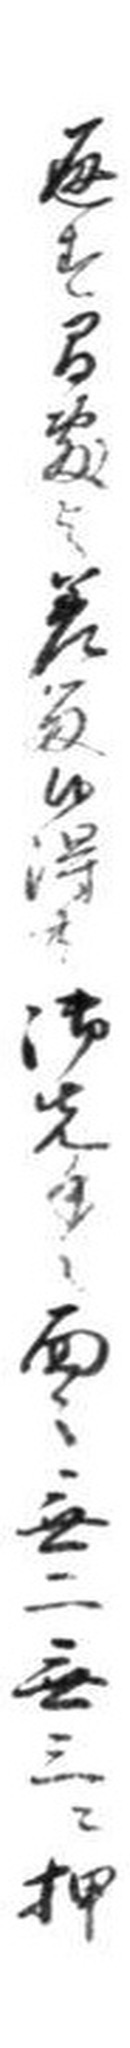通す間敷与差留候得共御先手之面々無二無三ニ押
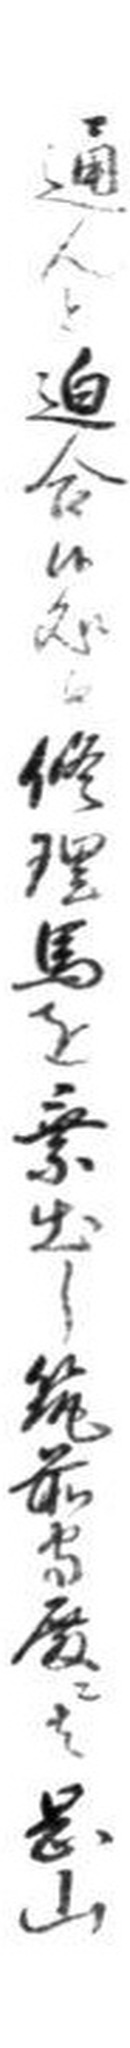通んと迫合候処江修理馬を乗出し筑前守殿ニ者岡山
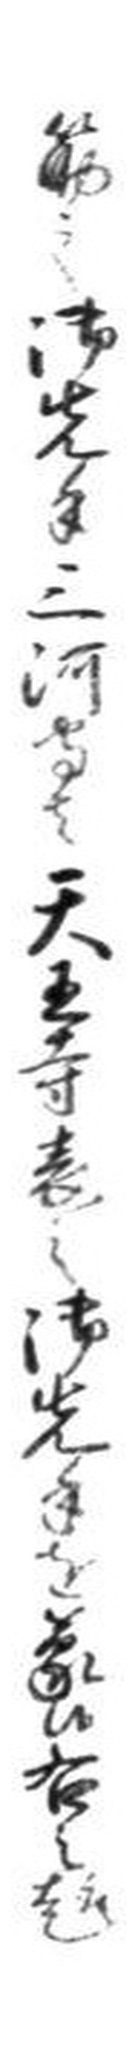筋之御先手三河守者天王寺表之御先手を蒙候右之趣
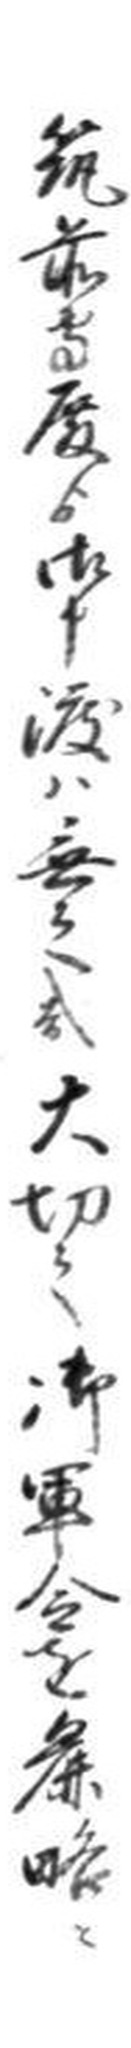筑前守殿ゟ御申渡ハ無之哉大切之御軍令を麁略ニ
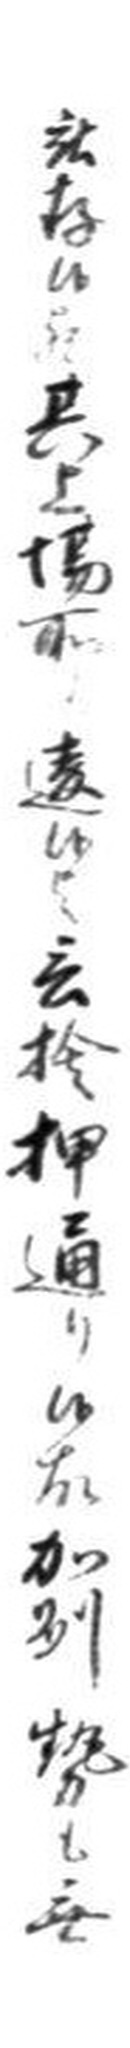被存候歟其上場所違候与言捨押通り候故加州勢も無
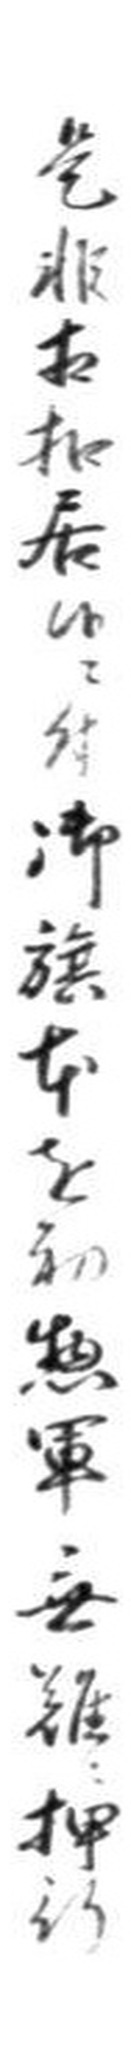是非相控居候ニ付御旗本を初惣軍無難ニ押行
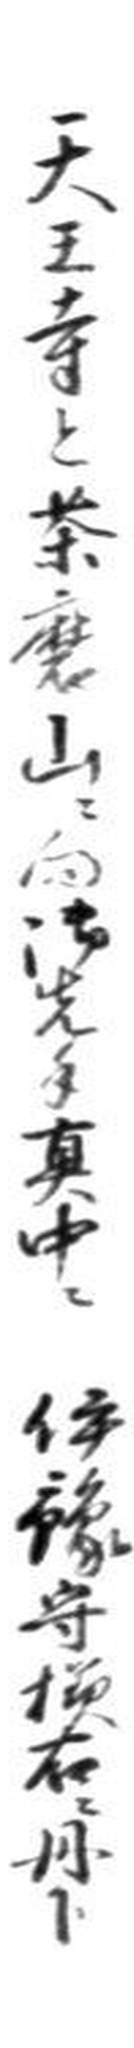天王寺と茶磨山ニ向御先手真中ニ伊予守様右ニ丹下
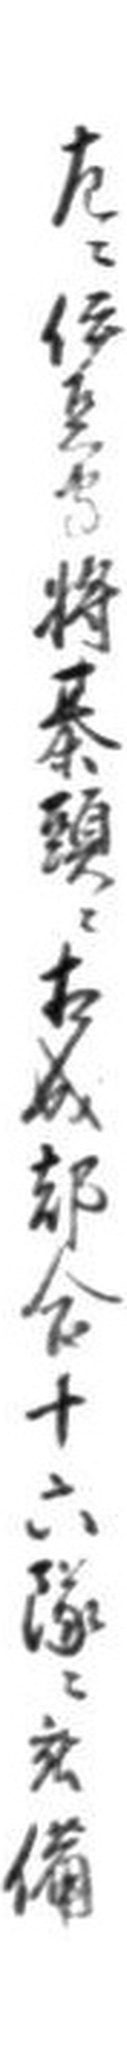左ニ伊豆守将棋頭ニ相成都合十六隊ニ被備
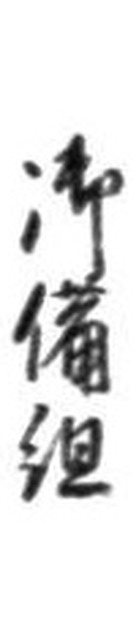御備組
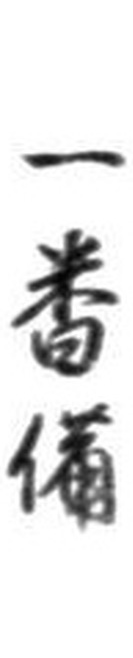一番備
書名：家譜 二 忠直公 従文禄四年到慶安四年
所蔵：福井県文書館 Fukui Prefectural Archives
